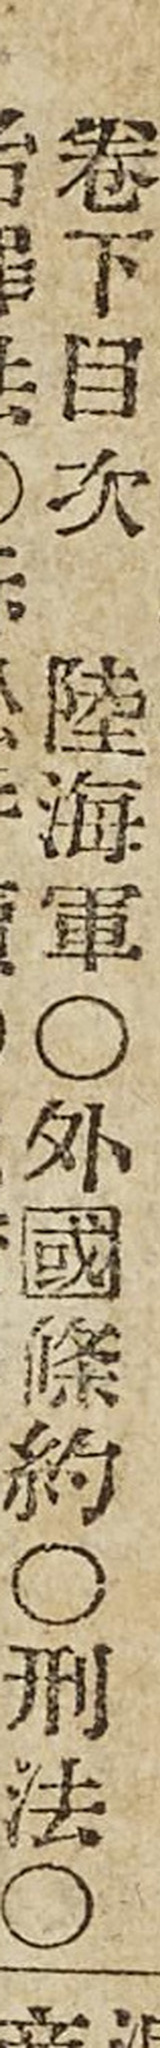巻下目次陸海軍○外国條約○刑法○
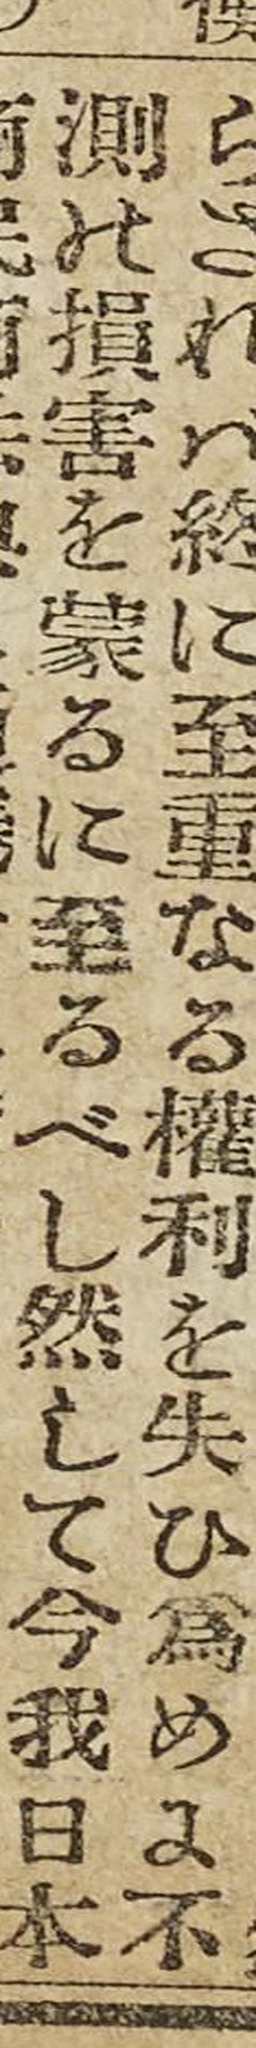測の損害を蒙るに至るべし然して今我日本
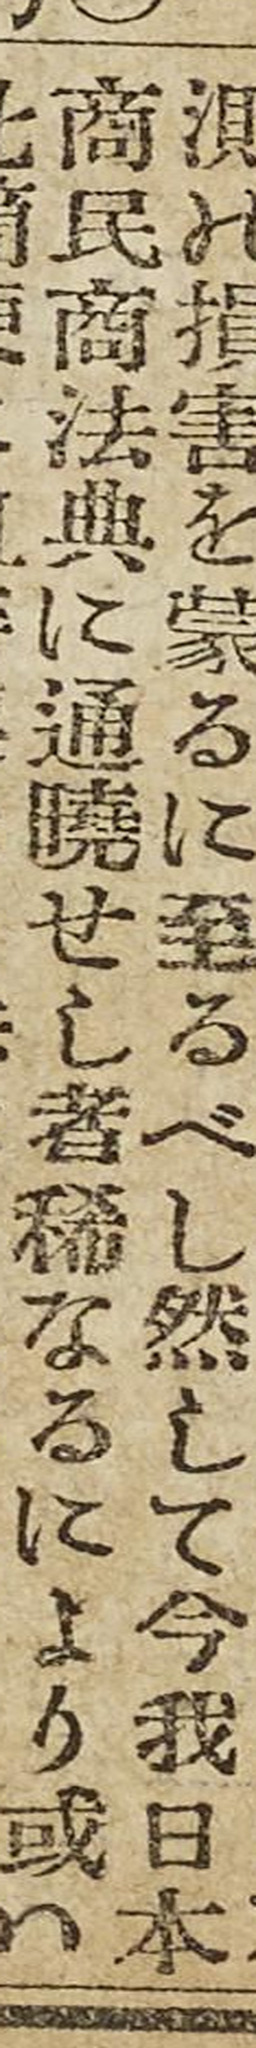商民商法典に通暁せし者稀なるにより或は
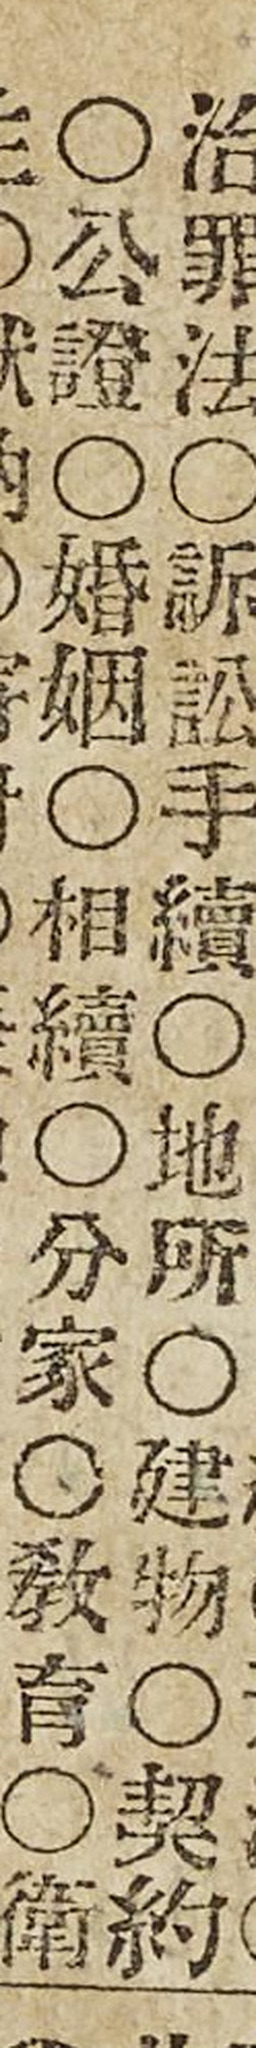○公証○婚姻○相続○分家○教育○衛
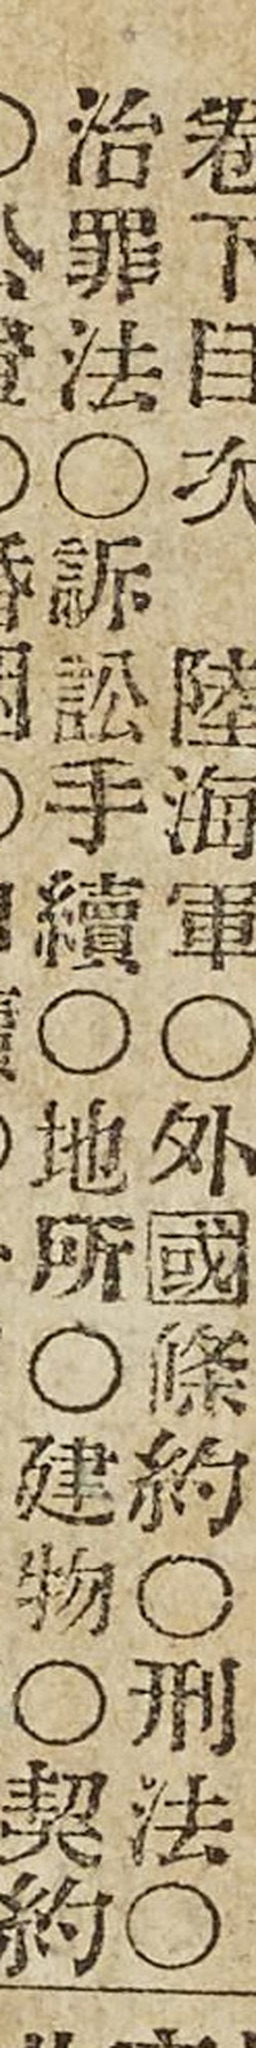治罪法○訴訟手続○地所○建物○契約
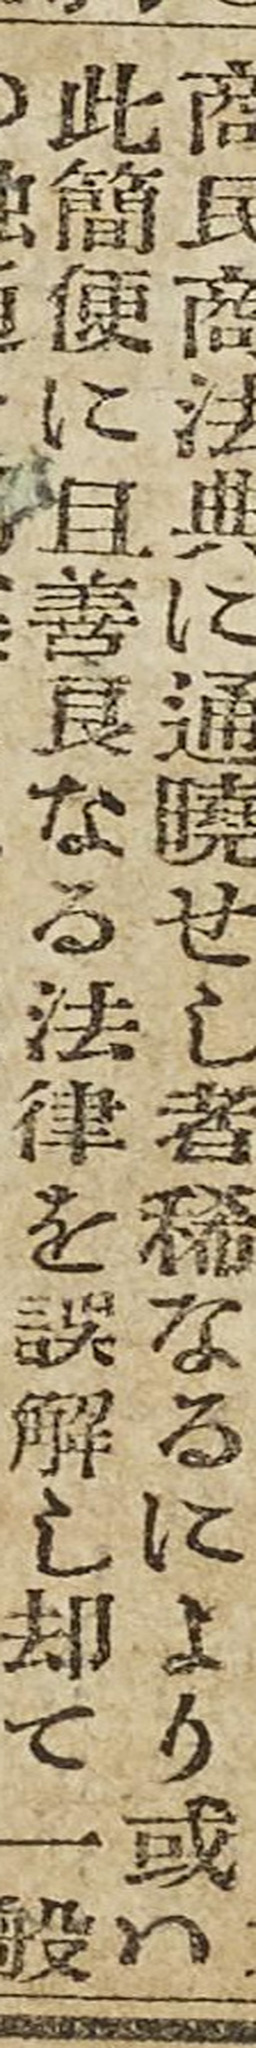此の簡便に且善良なる法律を誤解し却て一般
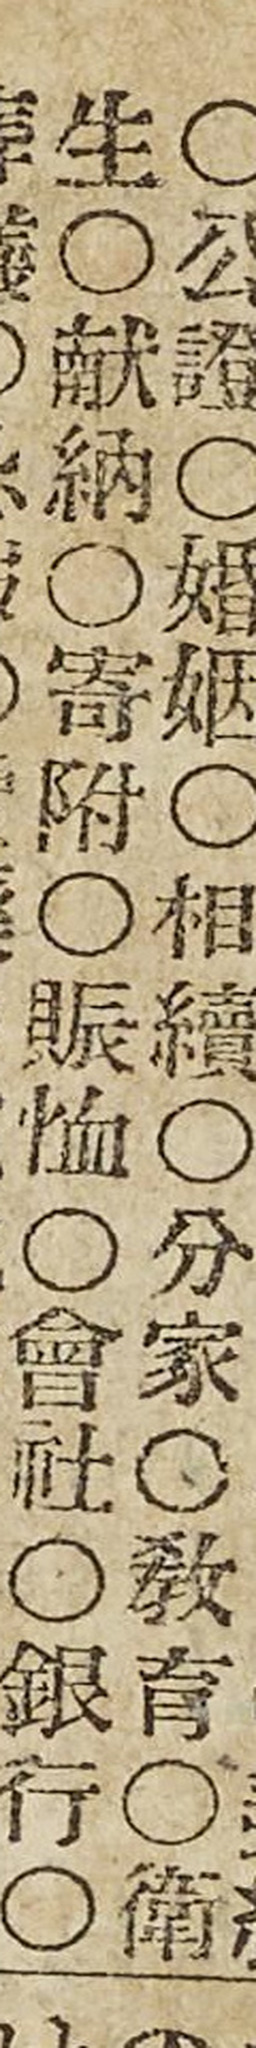生○献納○寄附○賑恤○会社○銀行○
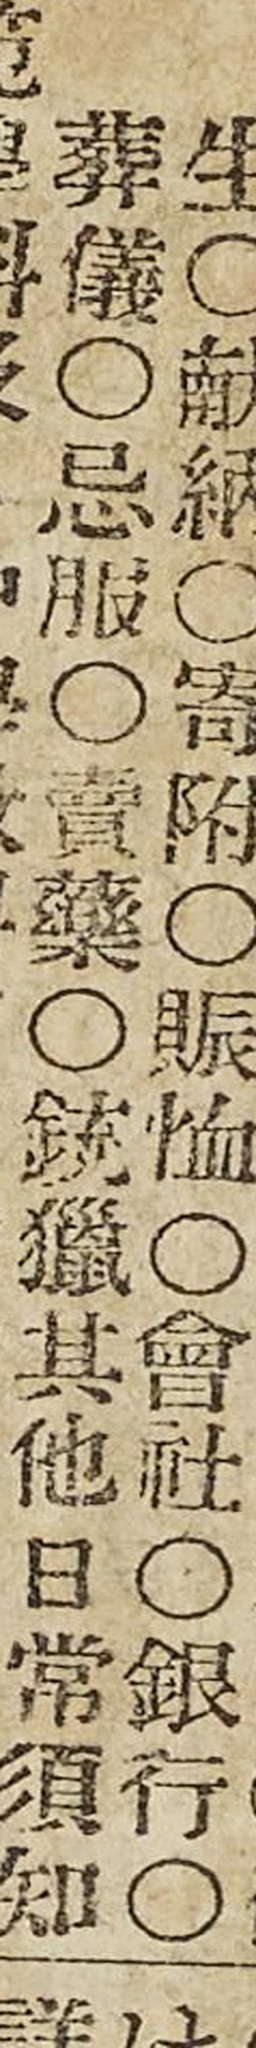葬儀○忌服○売薬○銃猟其他日常須知
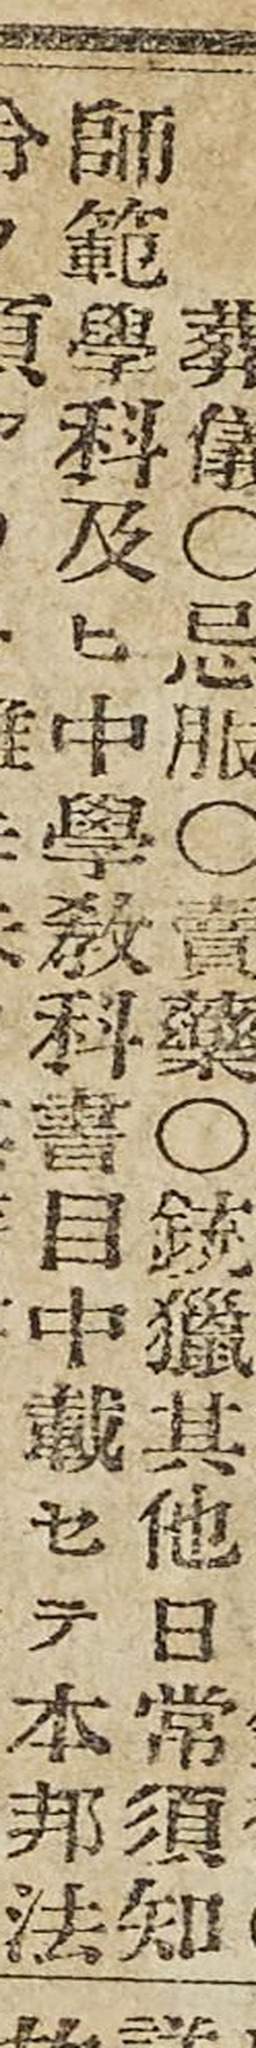師範学科及ヒ中学教科書目中載セテ本邦法
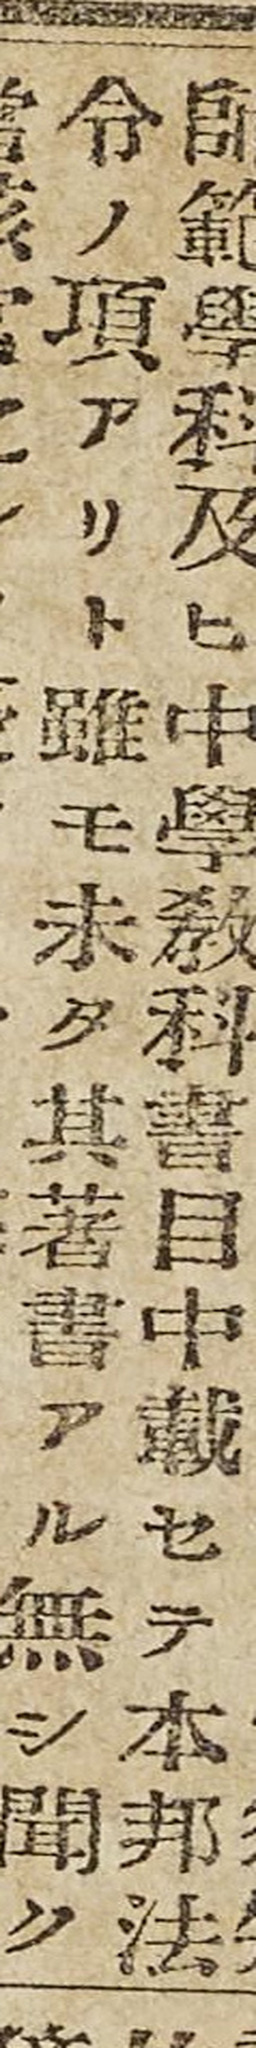令ノ項アリト雖モ未ダ其著書アル無シ聞ク
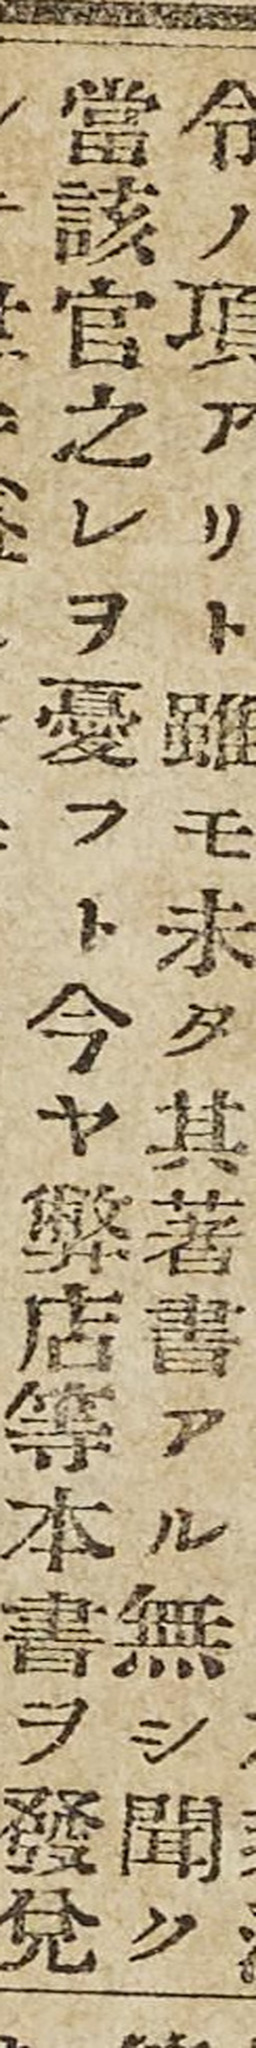当該官之レヲ憂フト今ヤ弊店等本書ヲ発兌
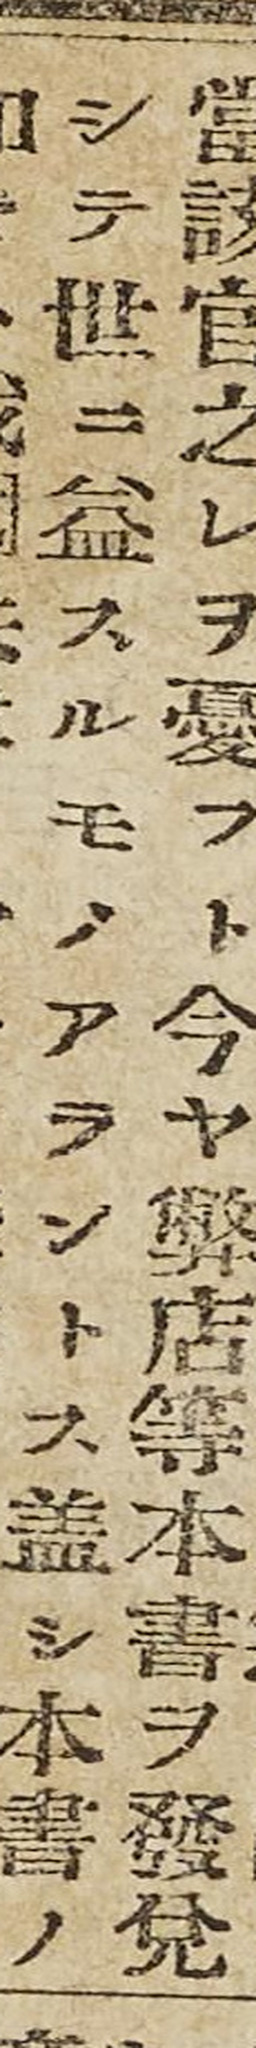シテ世ニ益スルモノアラントス蓋シ本書ノ
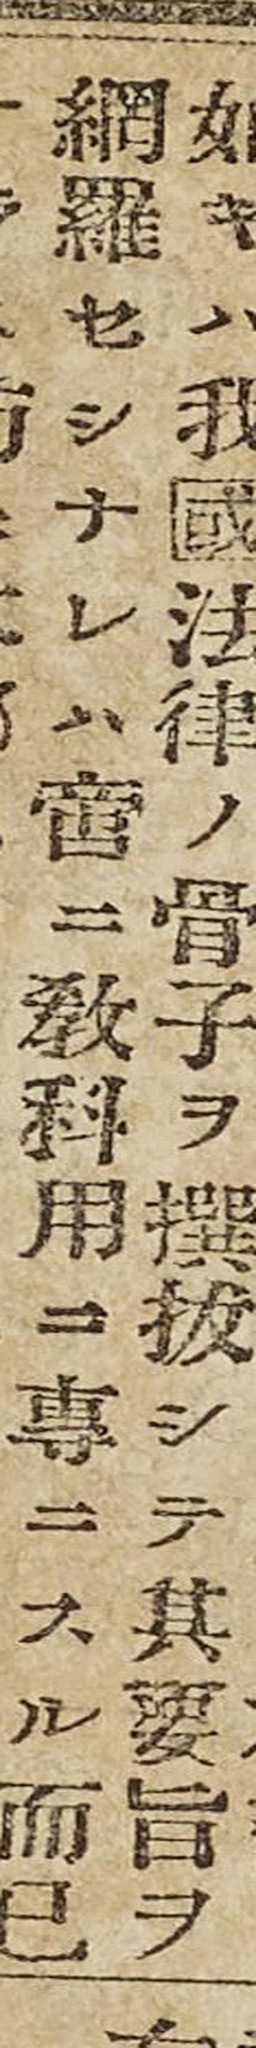網羅セシナレハ啻ニ教科用ニ専ニスル而已
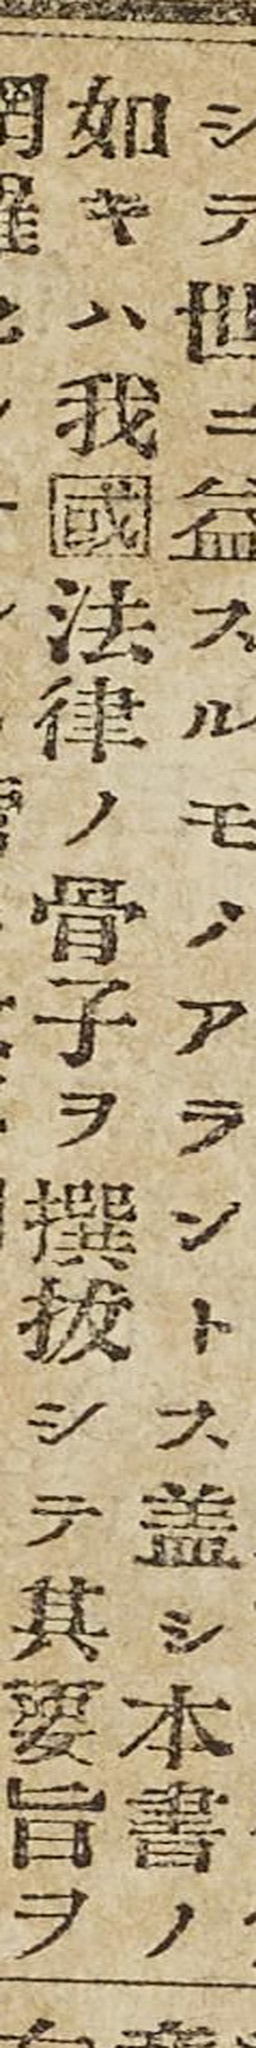如キハ我国法律ノ骨子ヲ選抜シテ其要旨ヲ
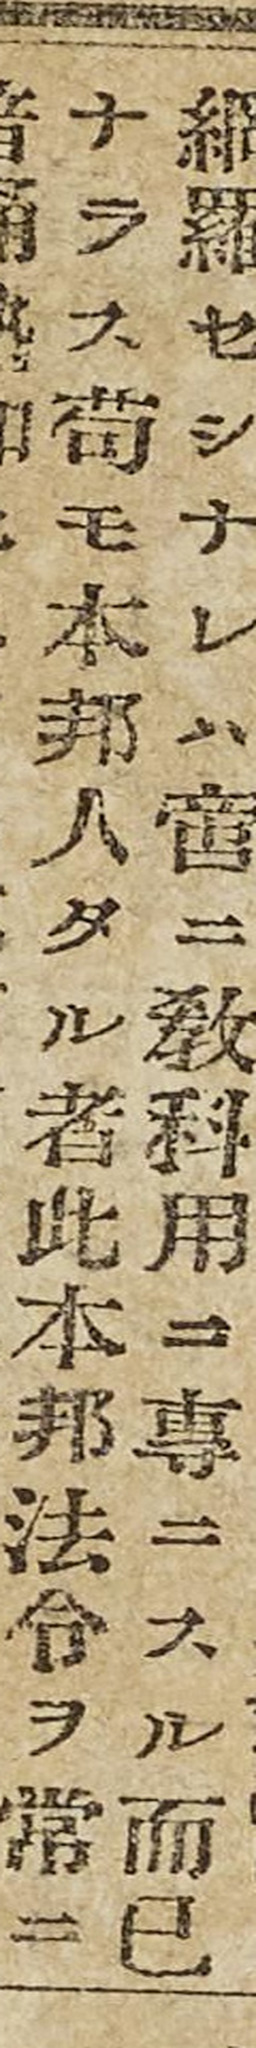ナラス苟モ本邦人タル者此本邦法令ヲ常ニ
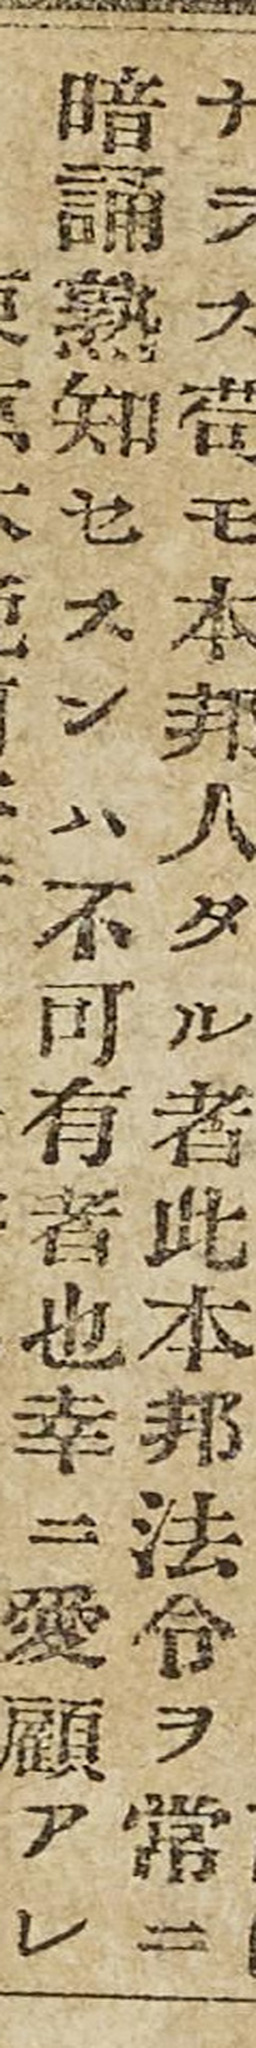暗誦熟知セズンハ不可有者也幸ニ愛顧アレ
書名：永代惨話　文化の夢　全
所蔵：東京大学地震研究所図書室 Earthquake Research Institute Library, The University of Tokyo, JAPAN
